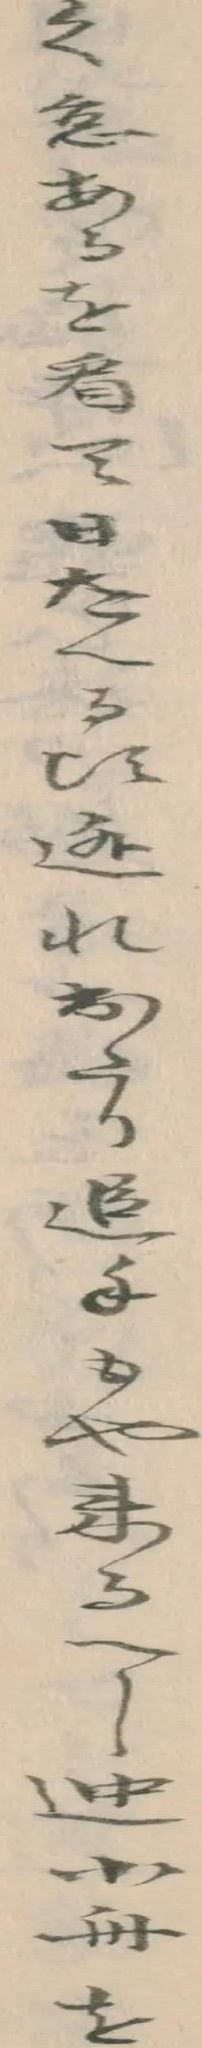く怠あるを看て日たへる頃逃れ出たり追手もや来るへし迚こ小舟を
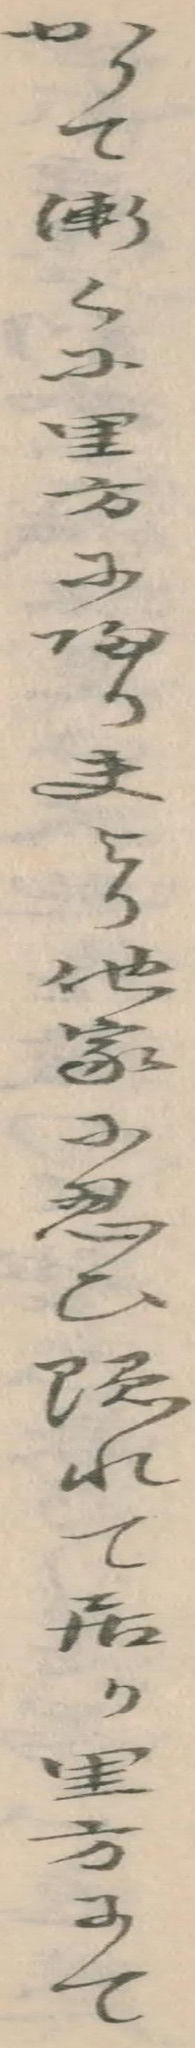かりて漸くに里方に帰り夫より他家に忍ひ隠れて居り里方にて
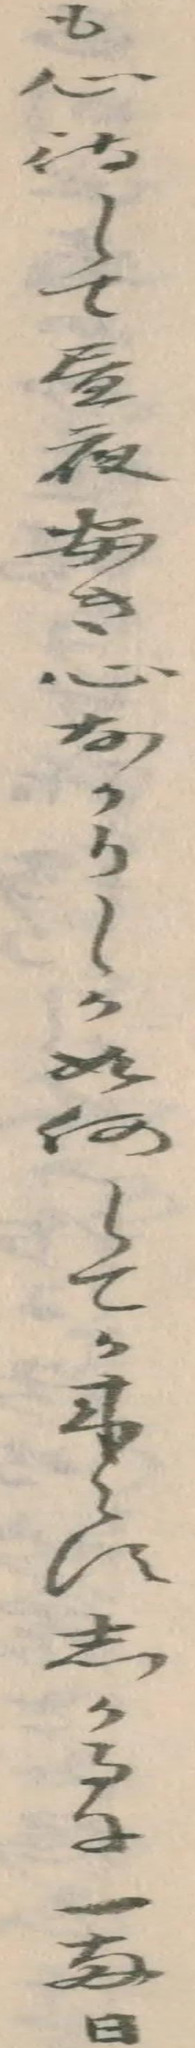も心待して昼夜安き心なかりしか如何してか来らすしかるに一両日
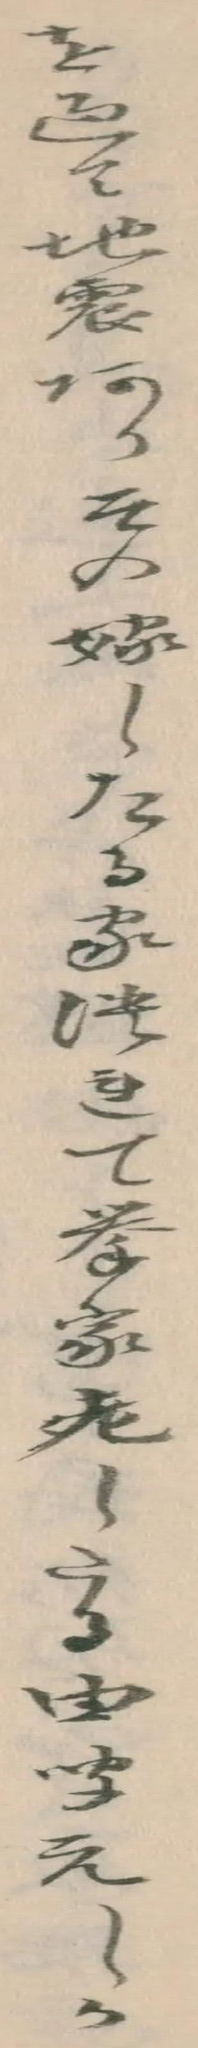を過て地震ありその嫁したる家潰れて挙家死したる由聞えしか
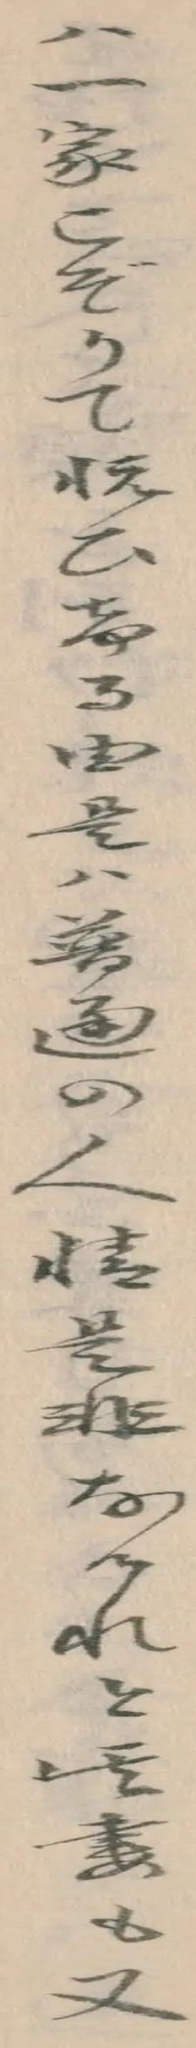は一家こぞりて悦ひける由是は普通の人情是非なけれと其妻も又
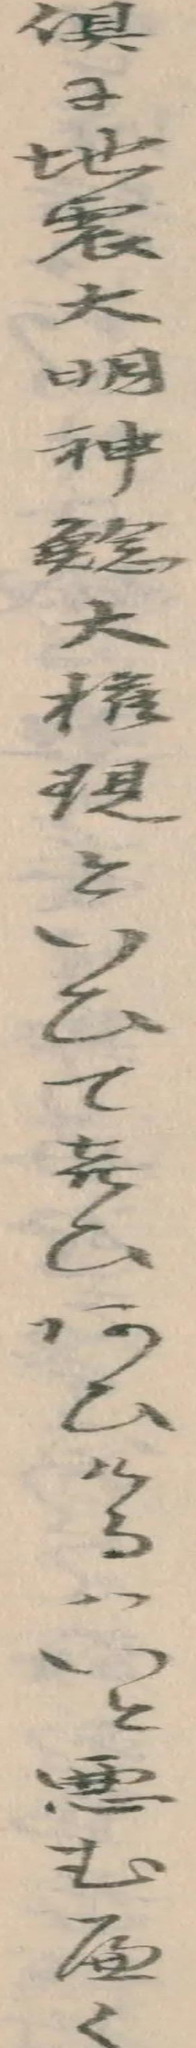倶に地震大明神鯰大権現といひて喜ひあひけるはいと悪むへく
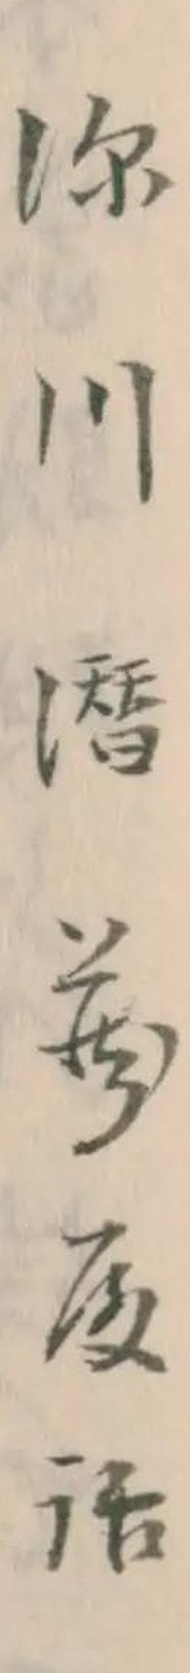深川潜蔵殿話
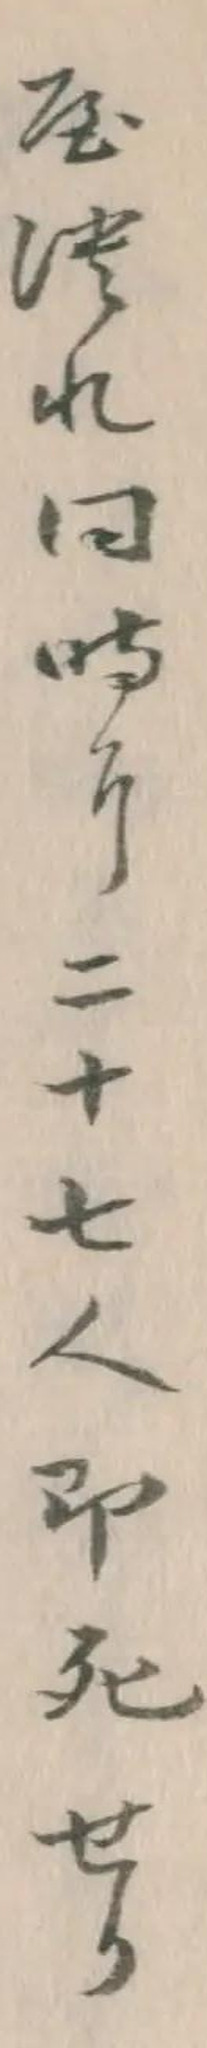屋潰れ同時に二十七人即死せり
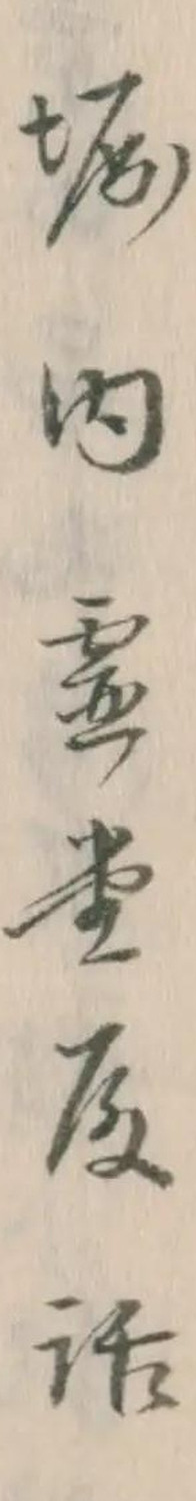堀内霊堂殿話
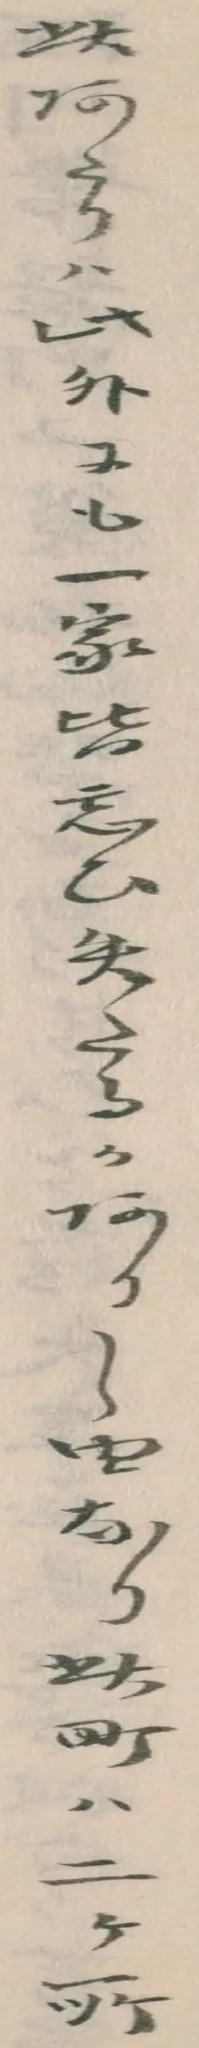此あたりは此外にも一家皆忘ひ失たるかありし由なり此町は二ヶ所
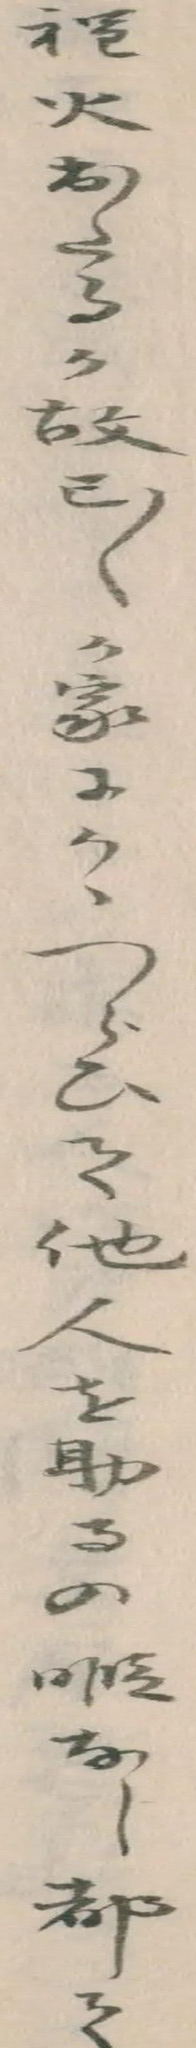程火出たるか故己〳〵か家にかゝつらひて他人を助るの暇なし都て
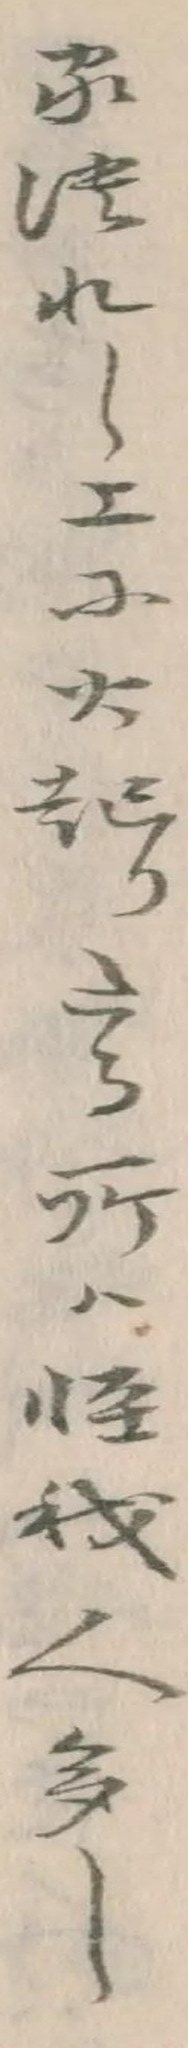家潰れし上に火起りたる所は怪我人多し
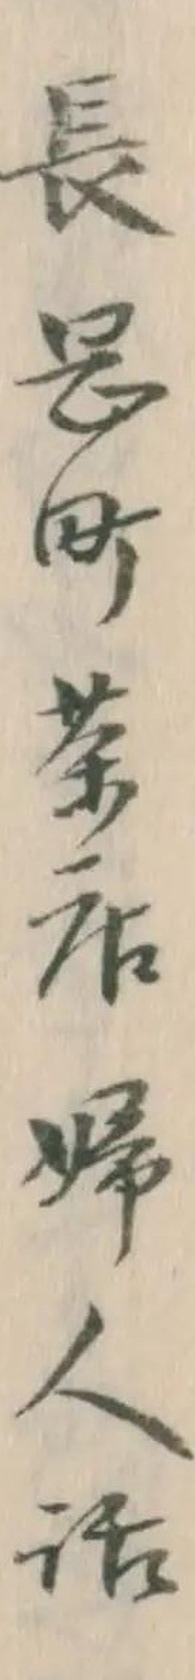長岡町茶店婦人話
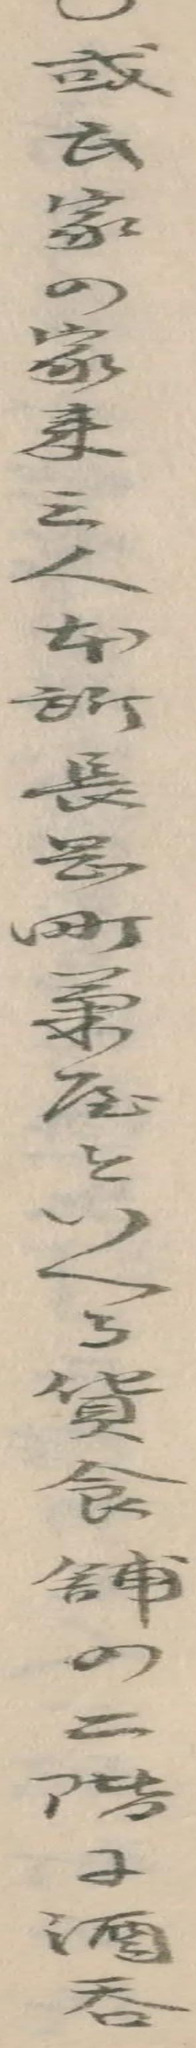〇或武家の家の家来三人本所長岡町菓屋といへる貨食舗の二階に酒呑

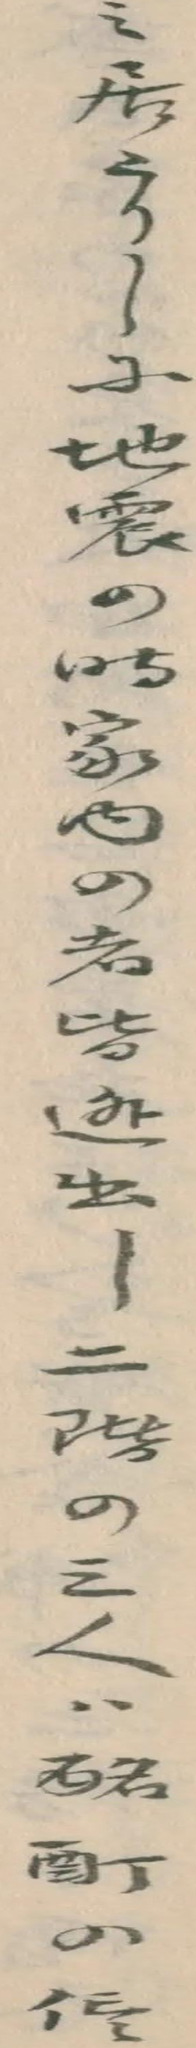み居たりしに地震の時家内の者皆逃出し二階の三人は酩酊の侭
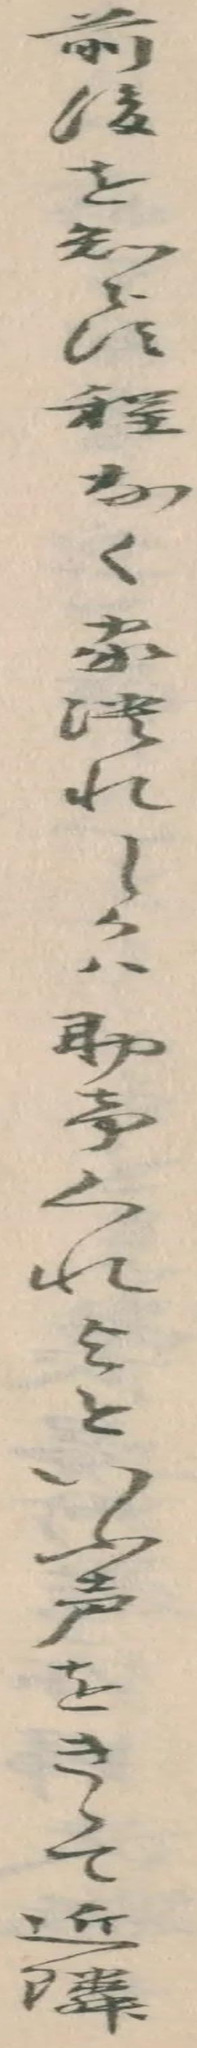前後を知らす程なく家潰れしかは助てくれよといふ声をきゝて近隣
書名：地災撮要. 巻7-9(地震之部)
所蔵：国立国会図書館 National Diet Library, JAPAN
